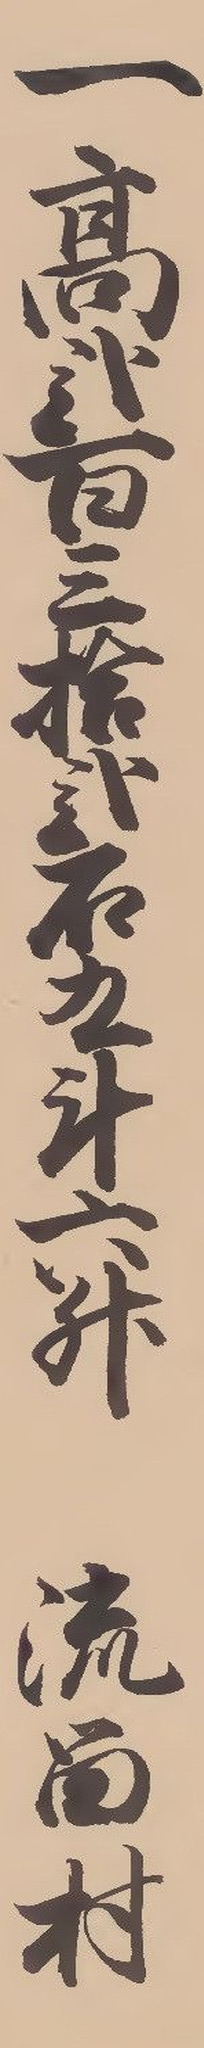一高弐百三拾弐石九斗六升流留村
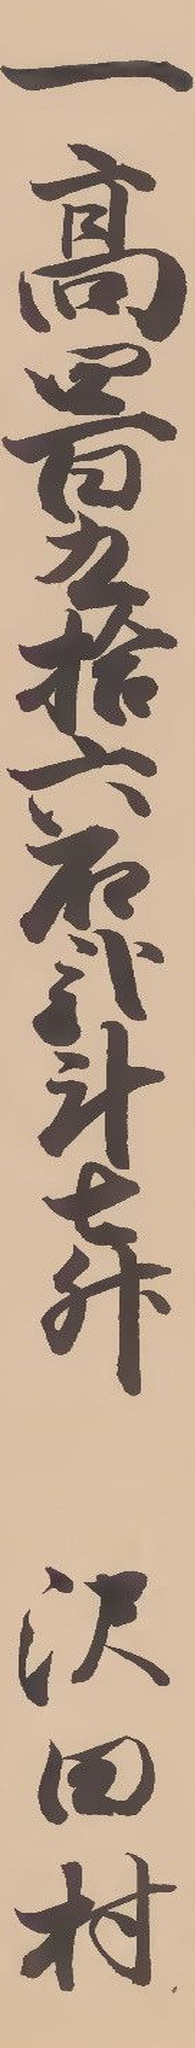一高四百九拾六石弐斗七升沢田村
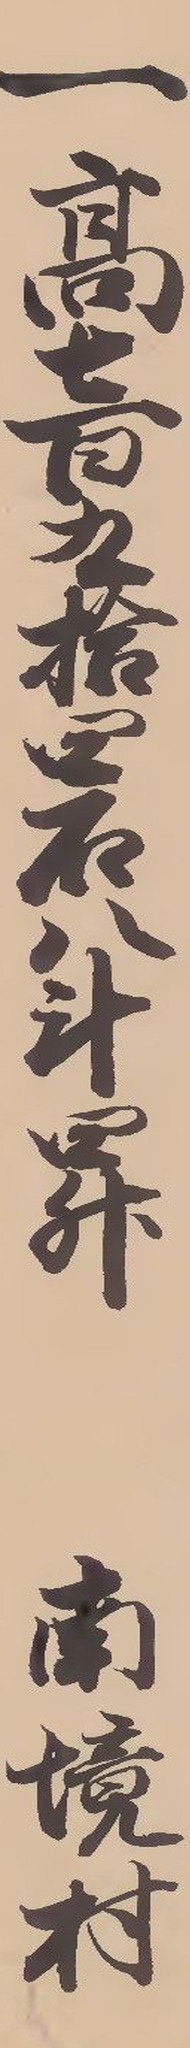一高七百九拾四石八斗四升南境村
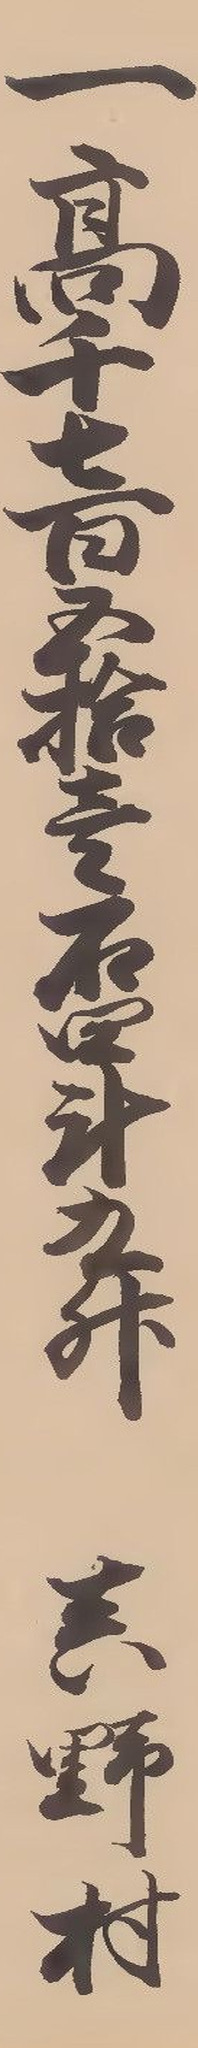一高千七百五拾壱石四斗九升真野村
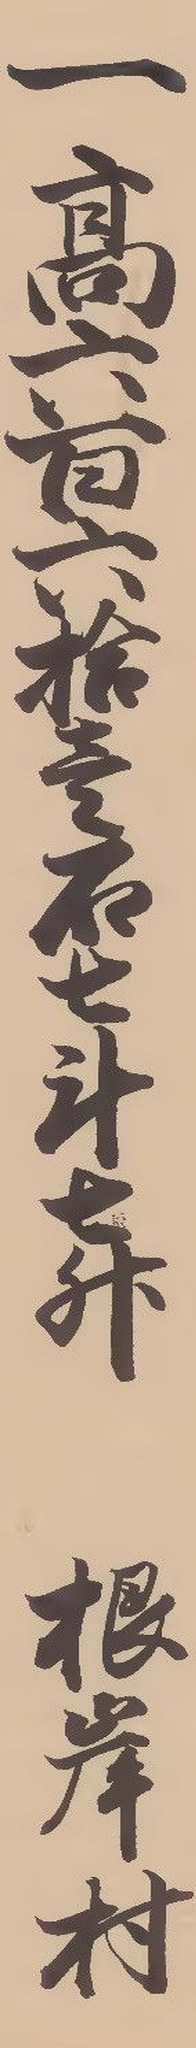一高六百六拾壱石七斗七升根岸村
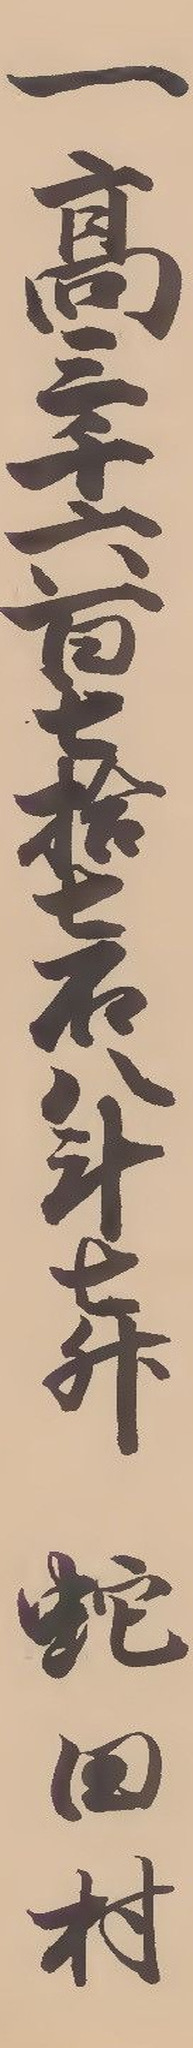一高三千六百七拾七石八斗七升蛇田村

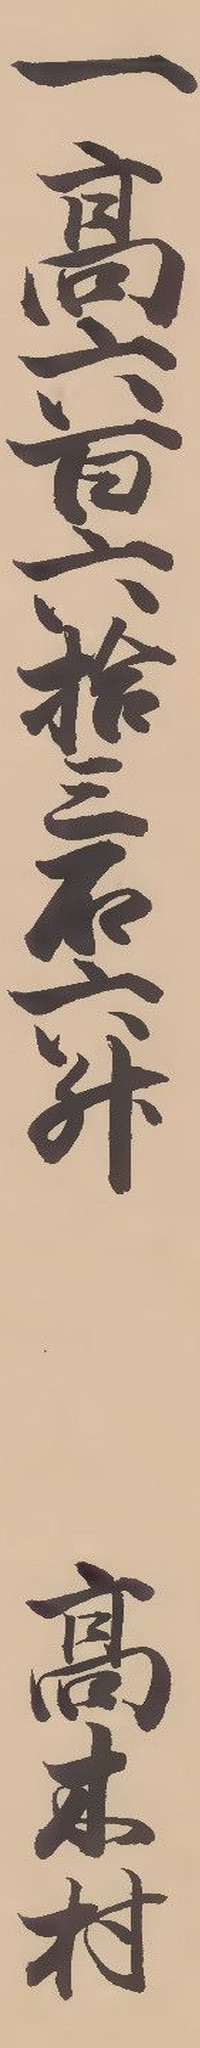一高六百六拾三石六升高木村
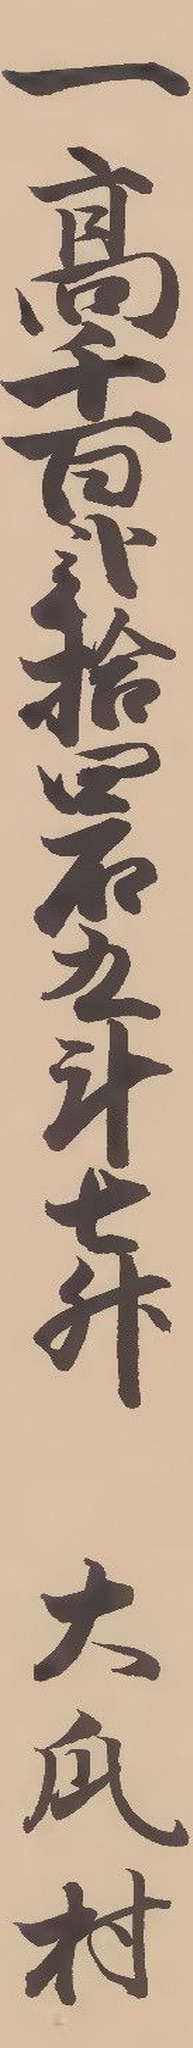一高千百弐拾四石九斗七升大瓜村
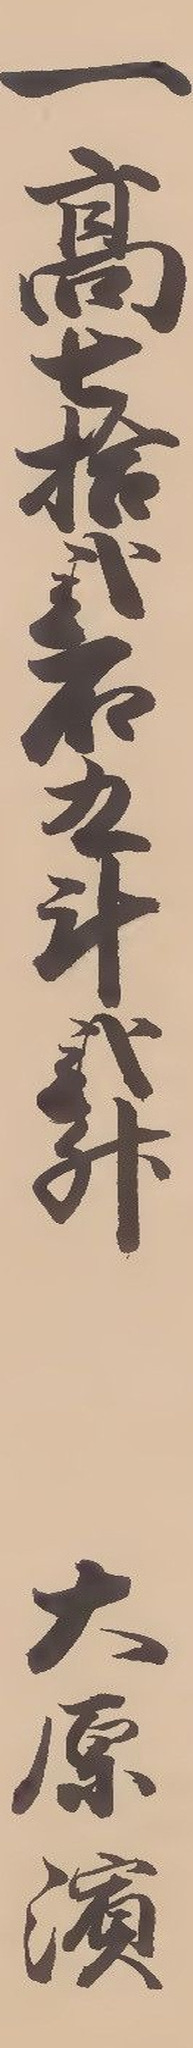一高七拾弐石九斗弐升大原浜
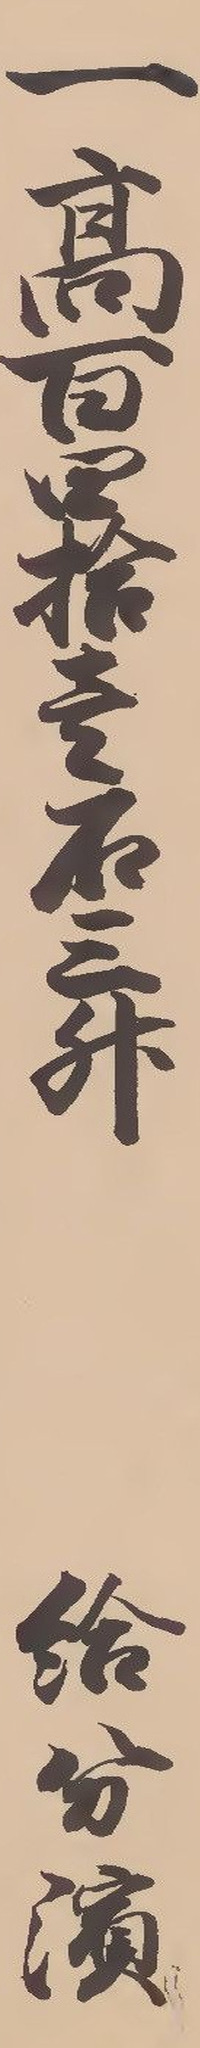一高百四拾壱石三升給分浜
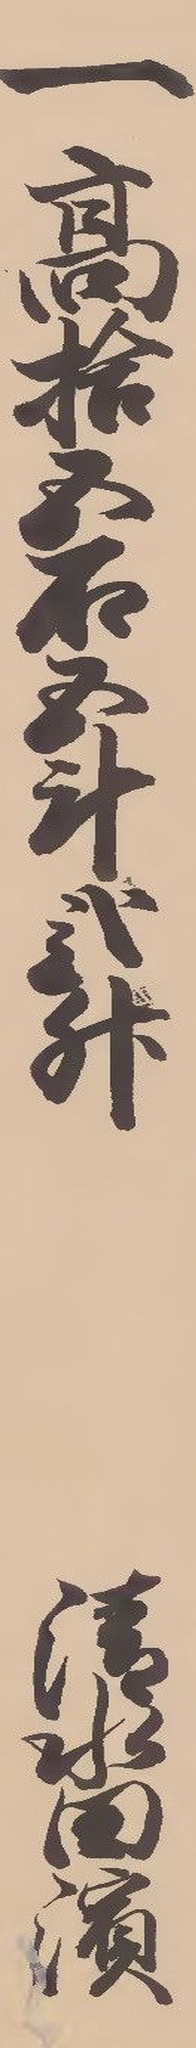一高拾五石五斗弐升清水田浜
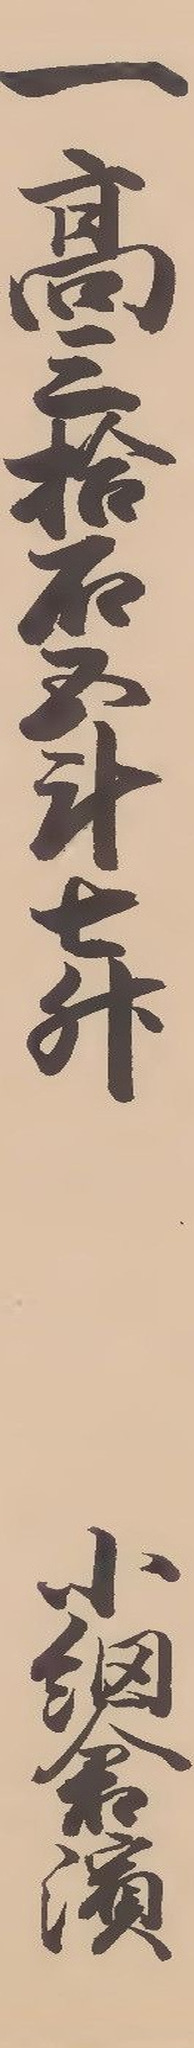一高三拾石五斗七升小網倉浜
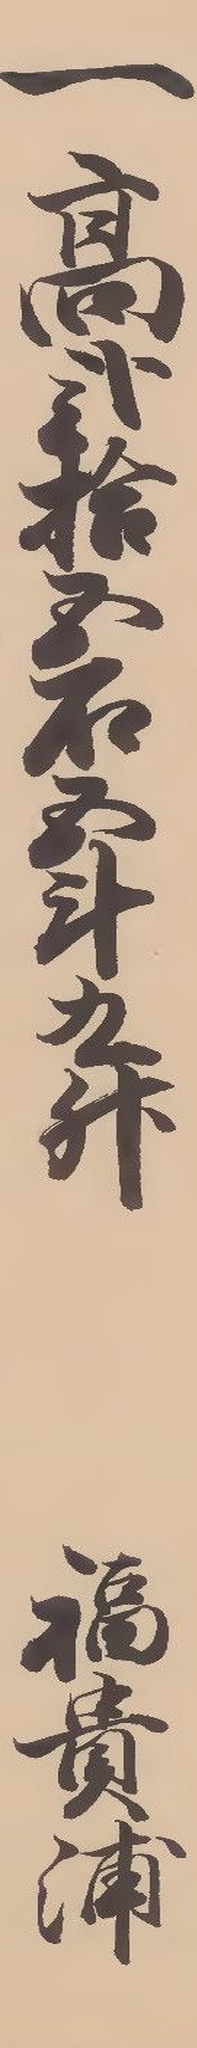一高弐拾五石五斗九升福貴浦
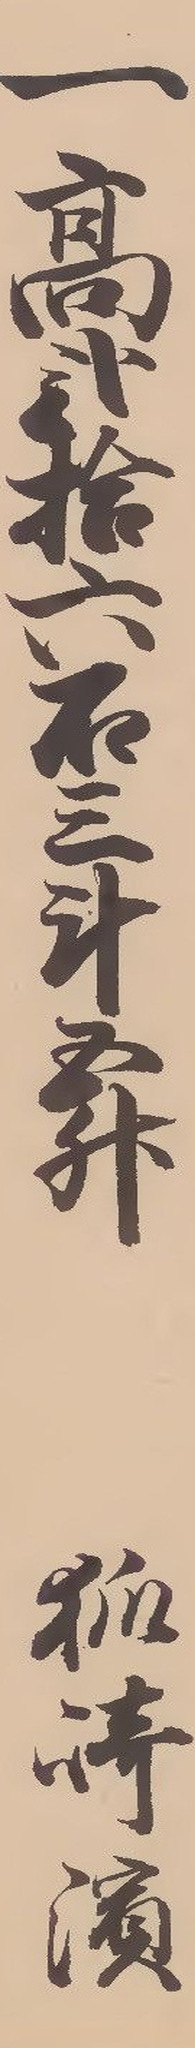一高弐拾六石三斗五升狐崎浜

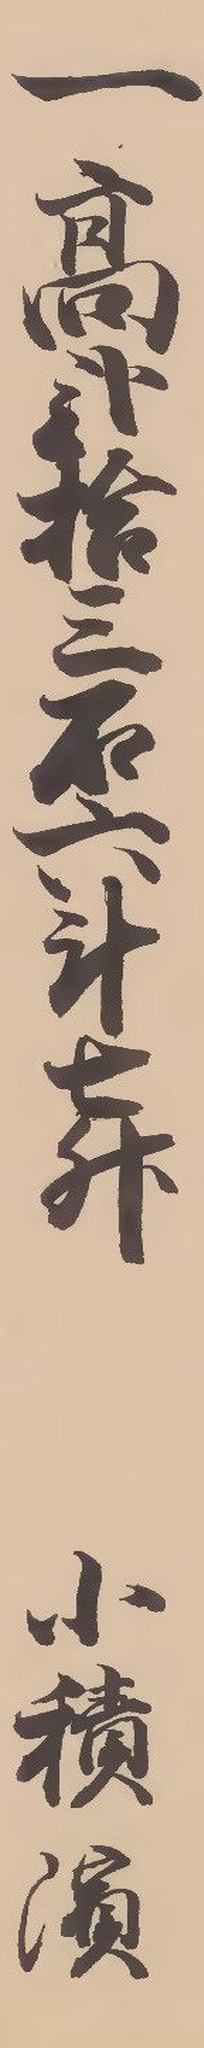一高弐拾三石六斗七升小積浜
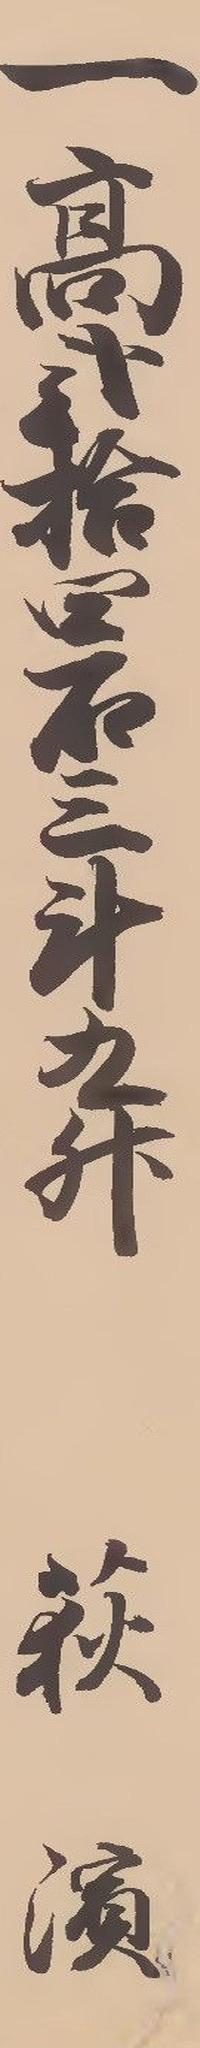一高弐拾四石三斗九升荻浜
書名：陸奥国郷帳　５
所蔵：国立公文書館 National Archives of Japan
